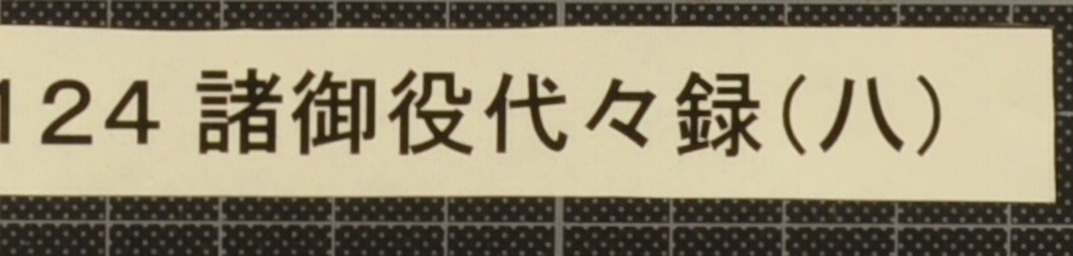諸御役代々録八
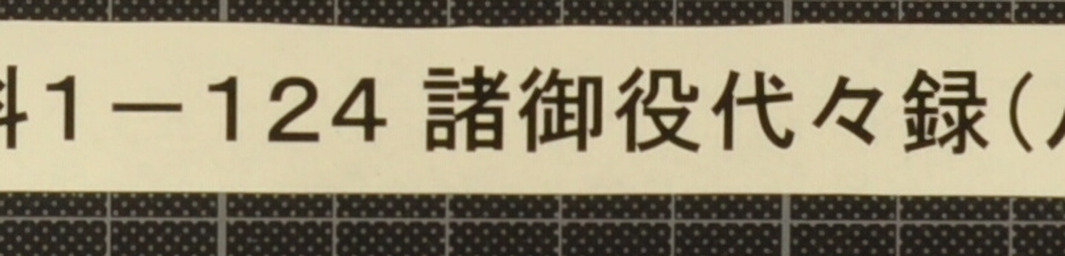諸御役代々録八
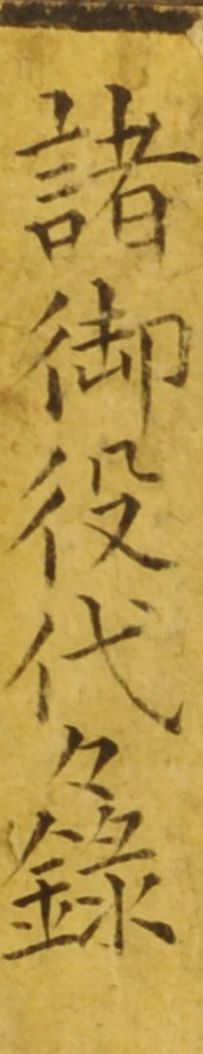諸御役代々録八

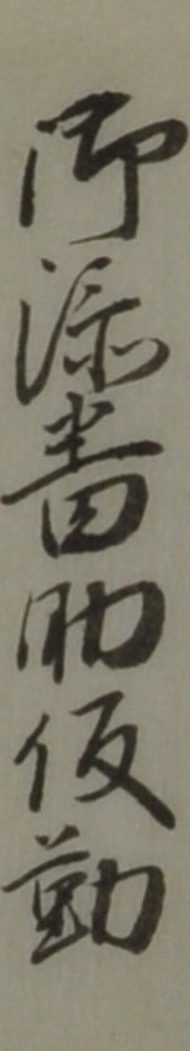御添番助仮勤
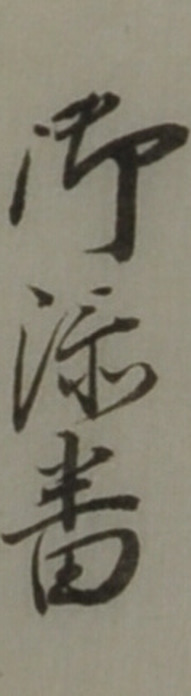御添番
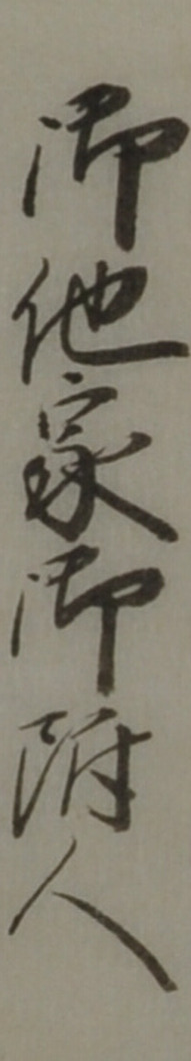御他家御附人
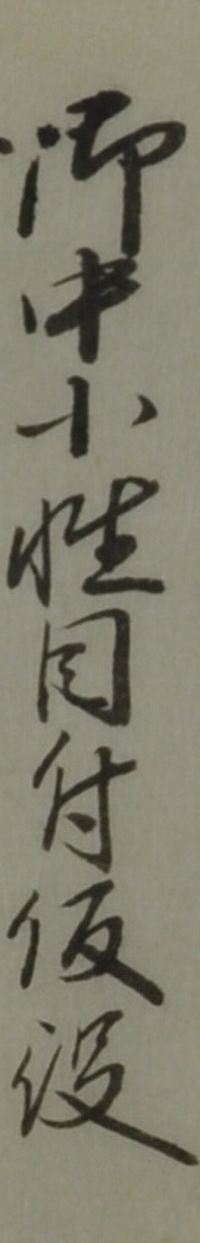御中小性目付仮役
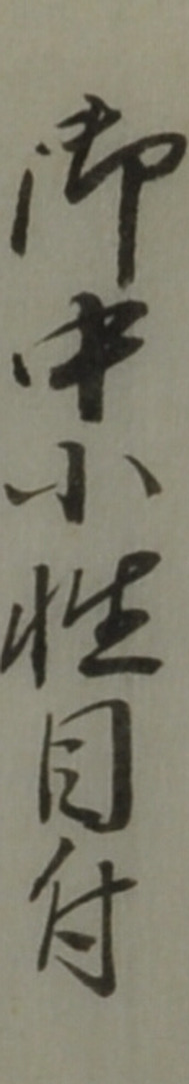御中小性目付
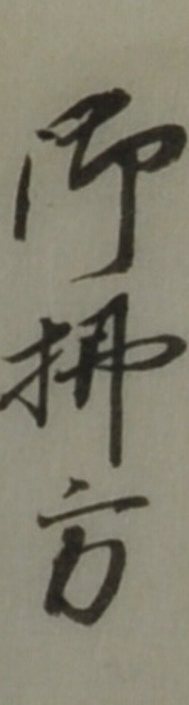御払方
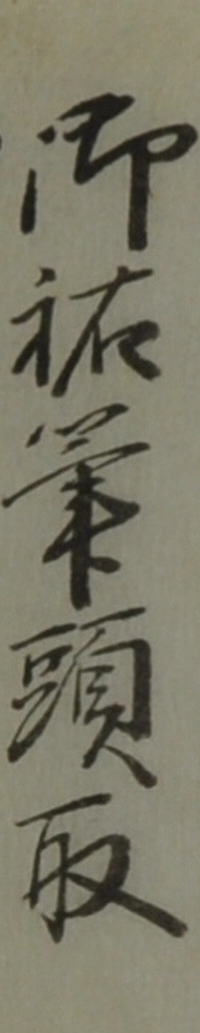御祐筆頭取
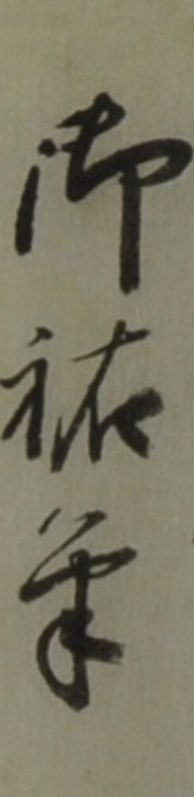御祐筆
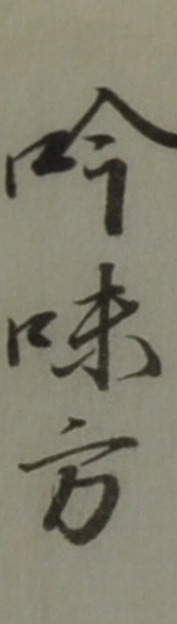吟味方
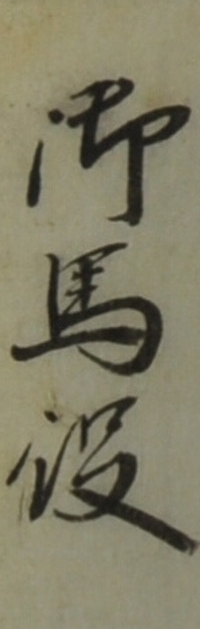御馬役

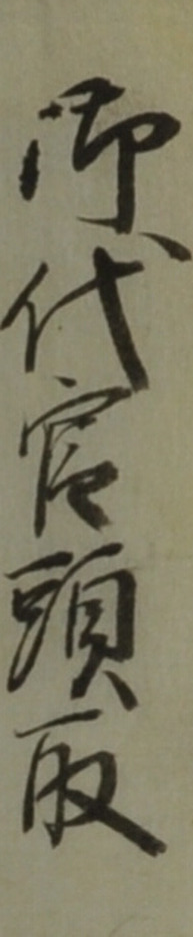御代官頭取
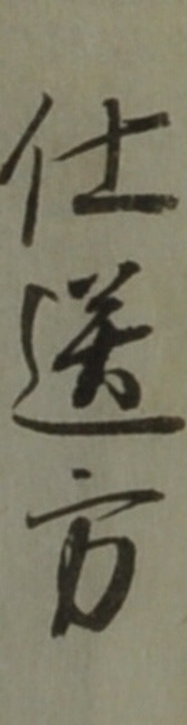仕送方
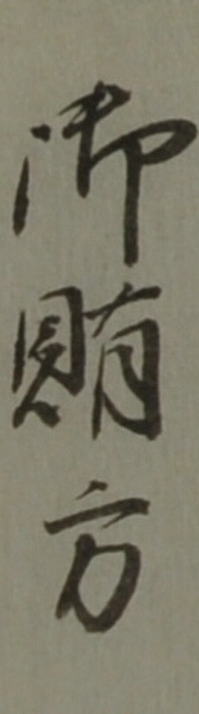御賄方
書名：諸御役代々録（八）
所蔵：伊那市立高遠町図書館・合同会社AMANE
